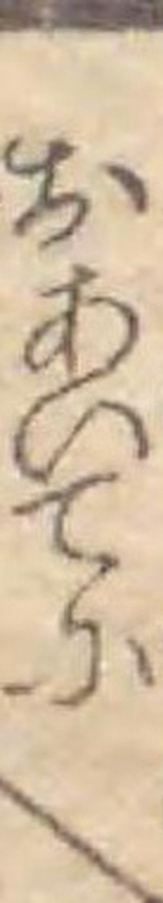おあいてに
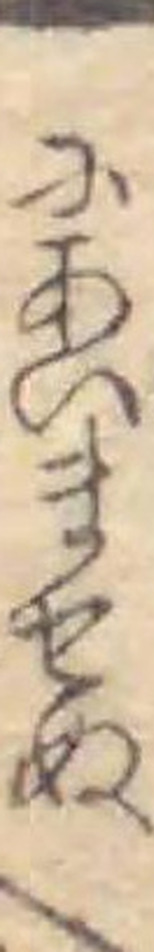にあいませぬ
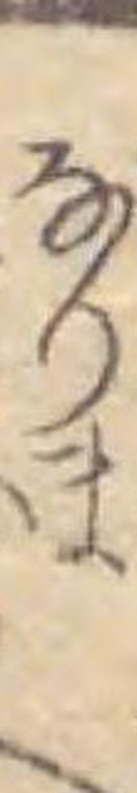なりま
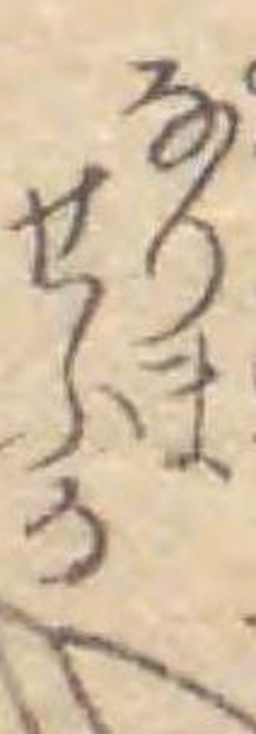せふか
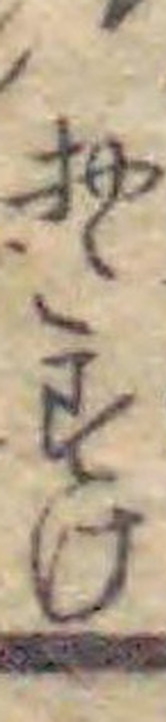おたすけ
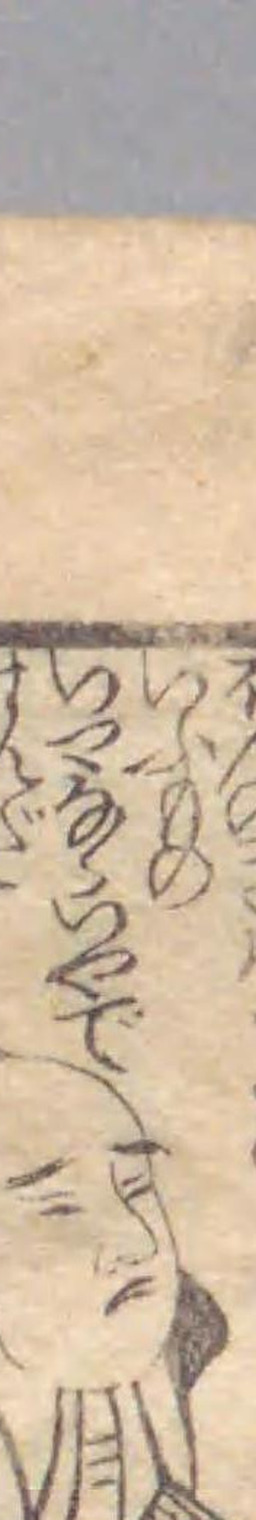いやならいやで
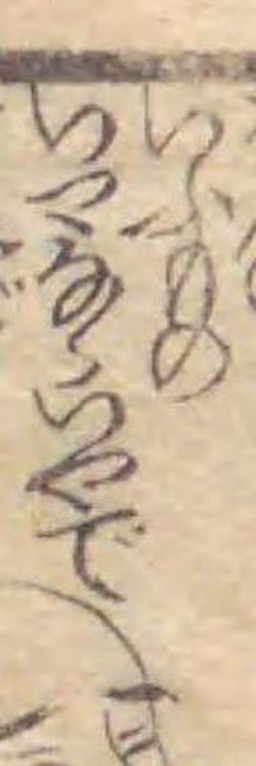いやならいやで
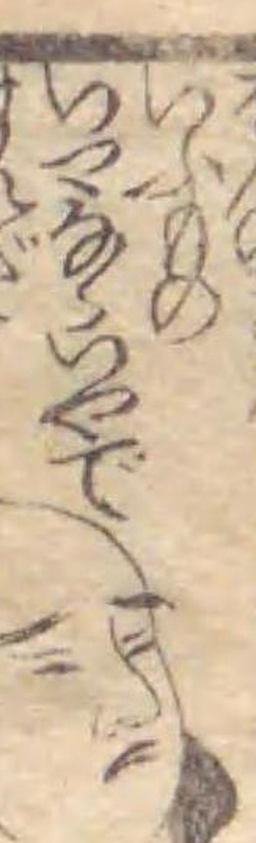いやならいやで
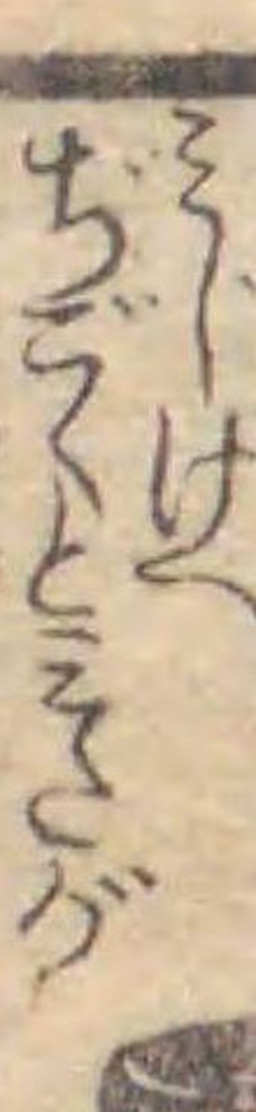ぢごくとみたが
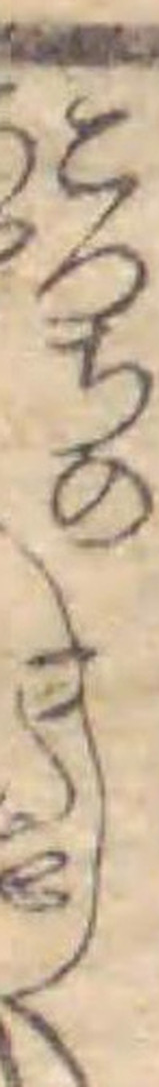こつちの

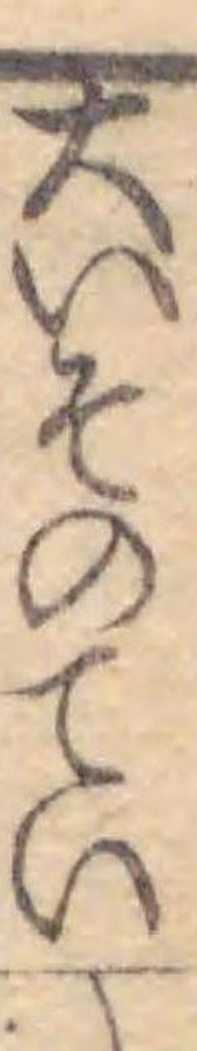大いそのてい
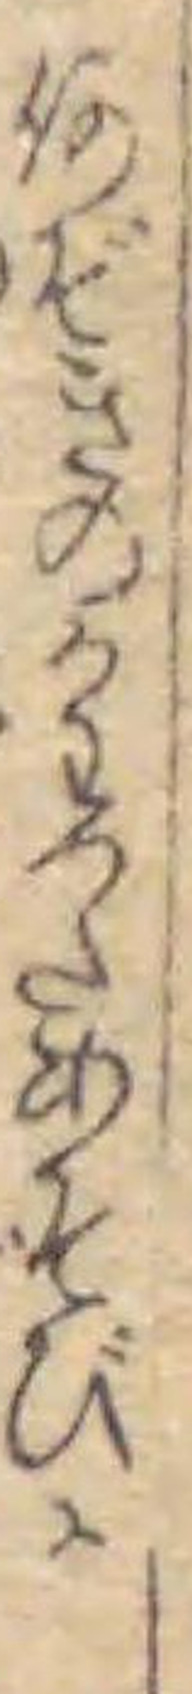何ぞきのかわつたあそびか
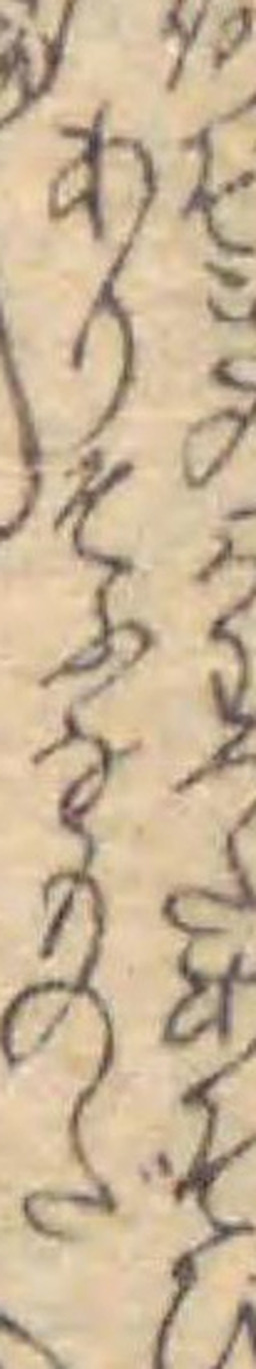ありそふなものだ
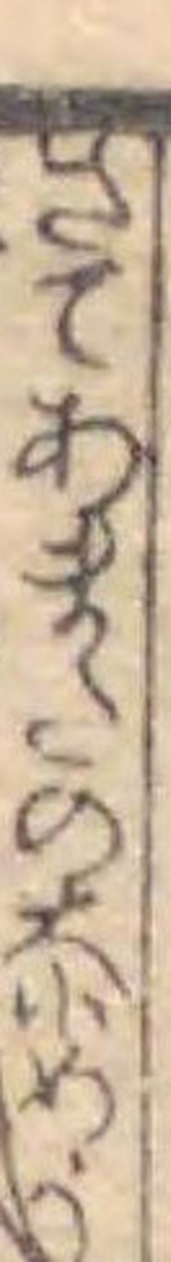わてあまたの大小めう
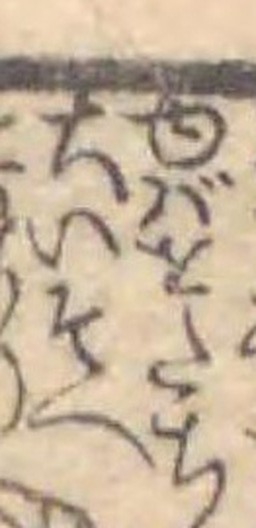大いそへ
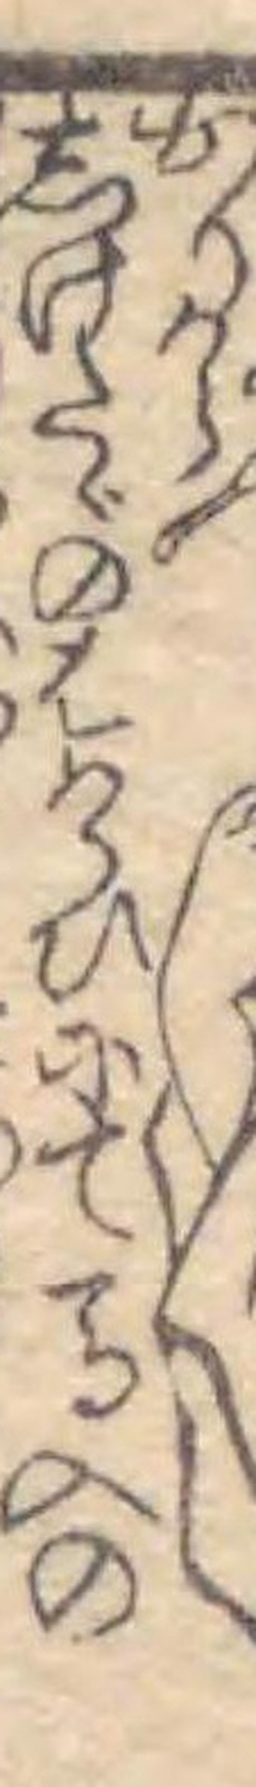しけたゞのはからひにて馬入の
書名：文武二道万石通 : 3巻
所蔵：国立国会図書館 National Diet Library, JAPAN
